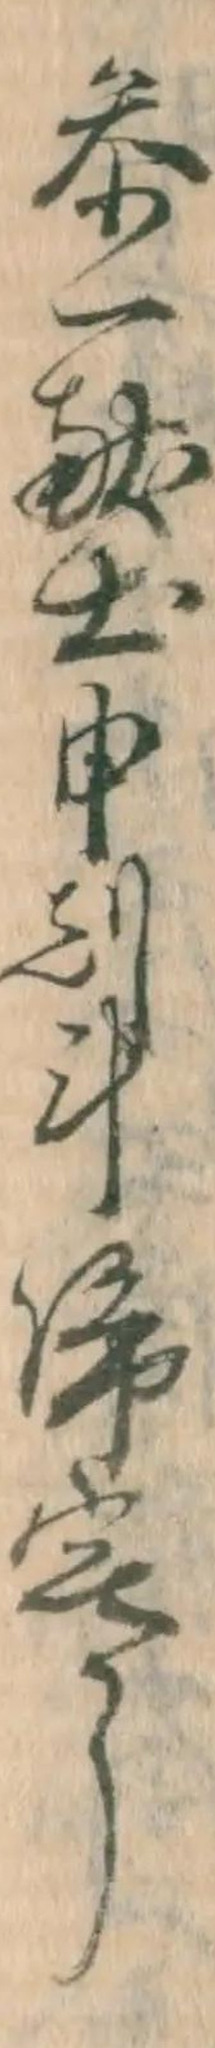参一献出申刻斗帰宅之
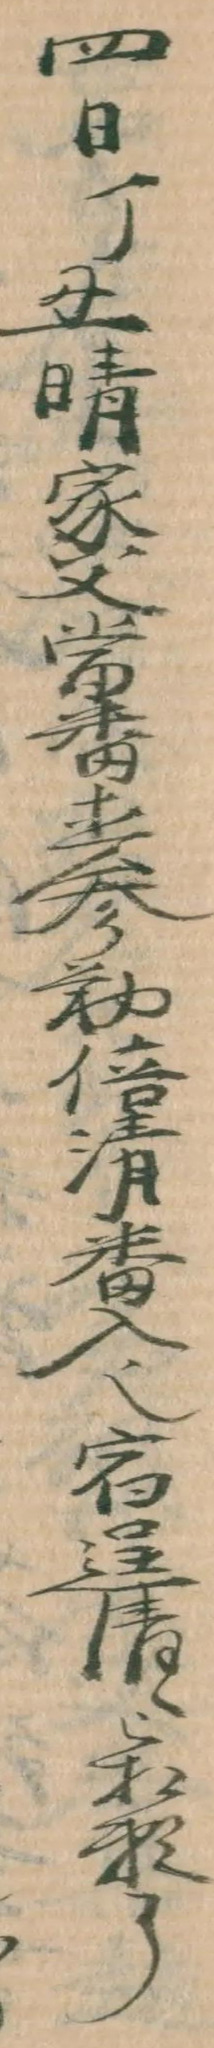四日丁丑晴家父當番直参勤倍清番入也宿逞清ヘ被相頼了
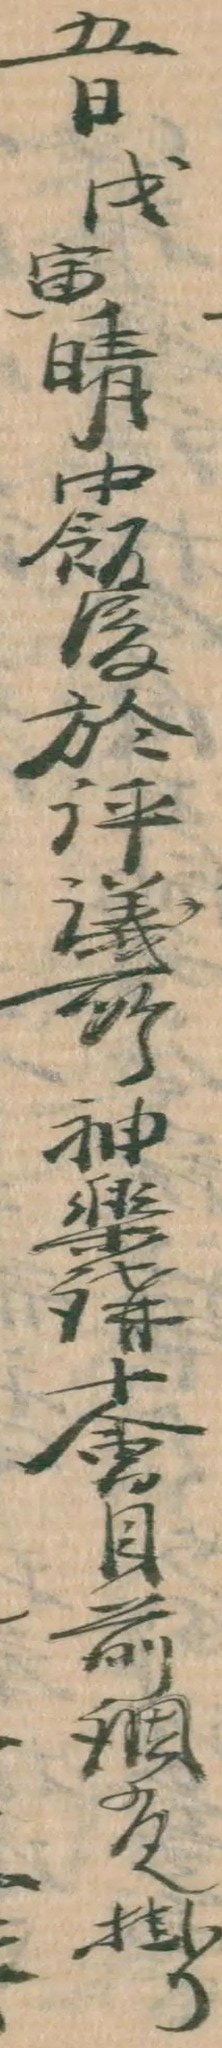五日戊寅晴中飯後於評議所神楽講十會目前銅有之掛リ
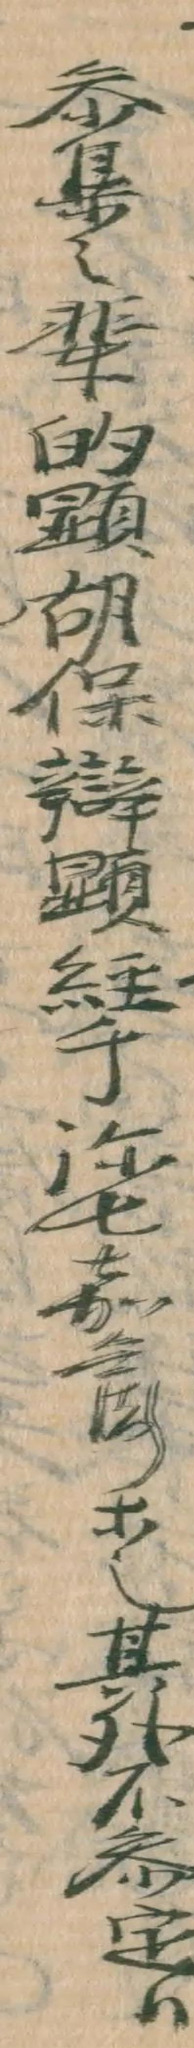参集之輩的顕胡保辯顕経千弥七嘉良等也其外不参定候
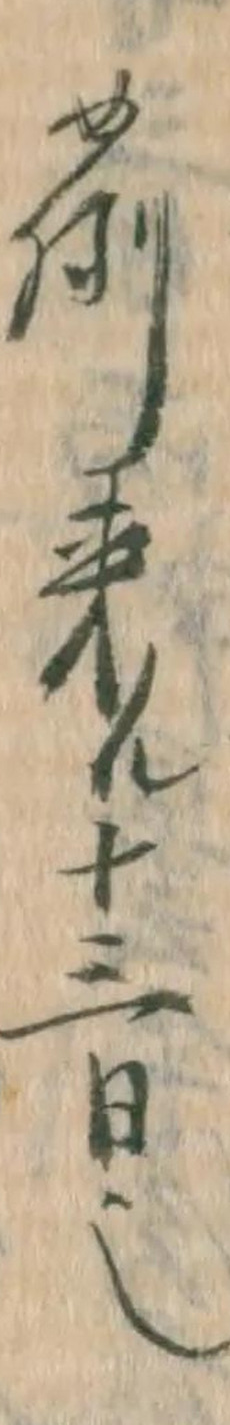如例来ル十三日也
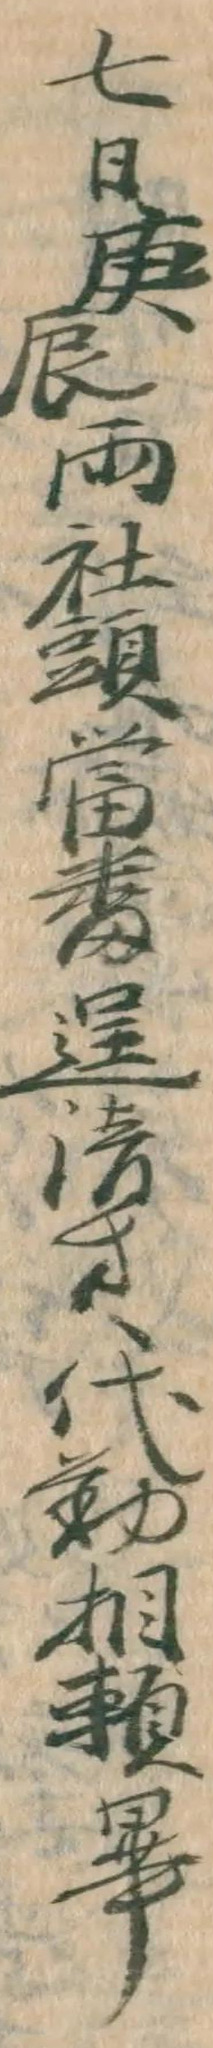七日庚巳雨社頭當番逞清方へ代勤相頼畢
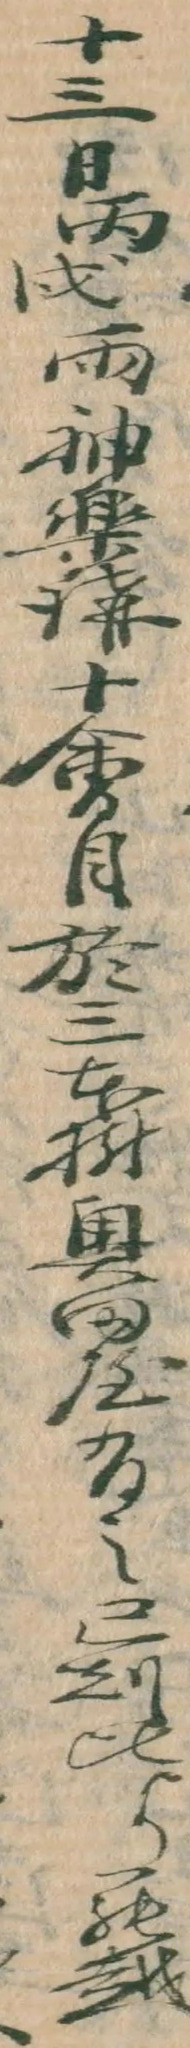十三日丙戌雨神楽講十會目於三本拵奥田屋有之巳刻比より罷越
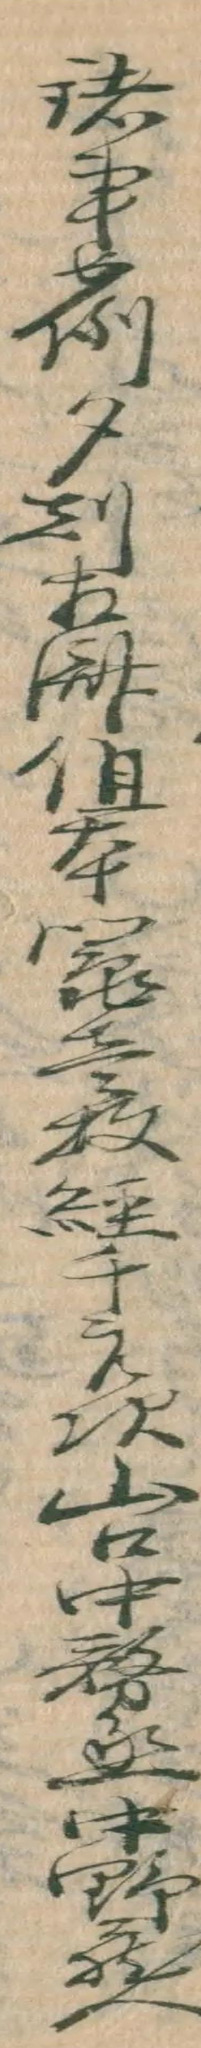諸事如例夕刻相済但大本鬮壱枚経千充次山口中務丞中野蔵人
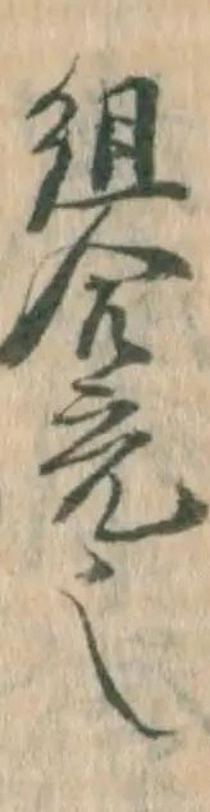組合充也
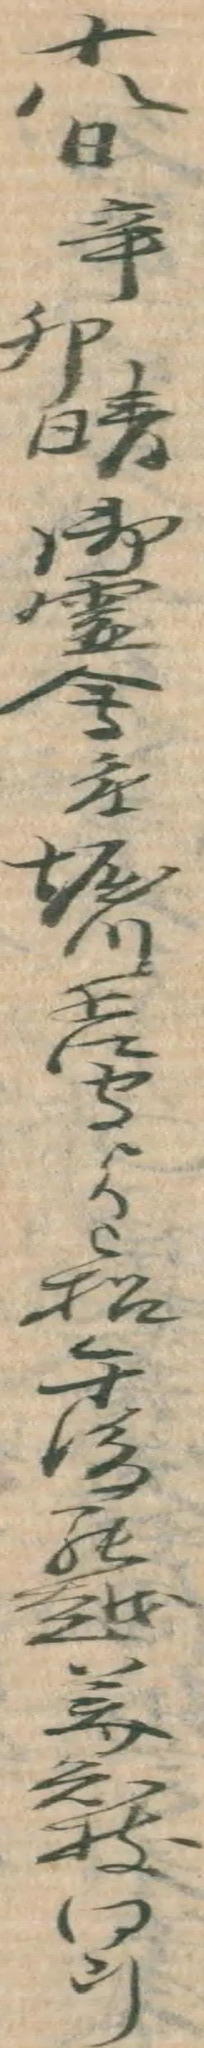十八日辛卯晴御霊會ニ付堀川近江守より被招午後罷越美知枝同引
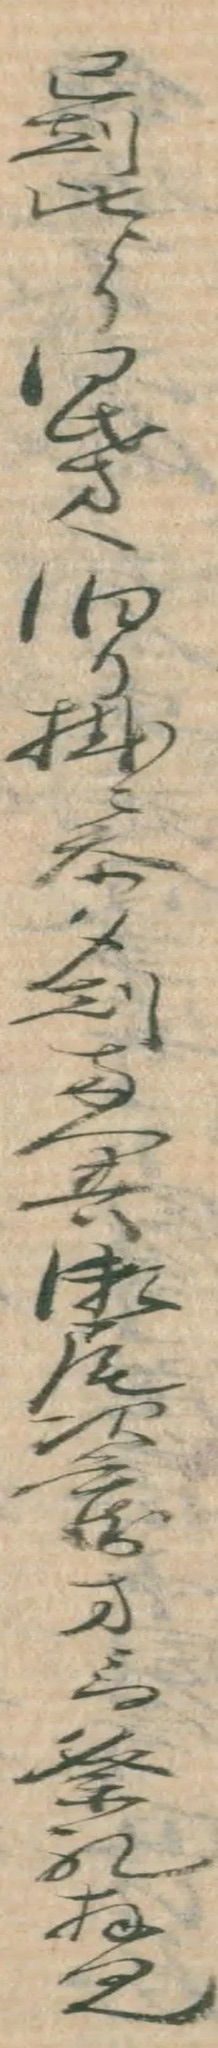已刻比より同氏方へ泊り掛に参夕刻両人共瀬尾次蔵方ニ而祭礼拝見
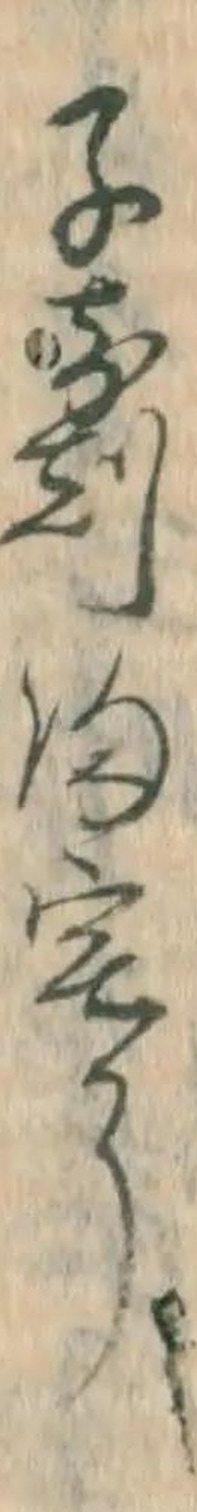子前刻帰宅了

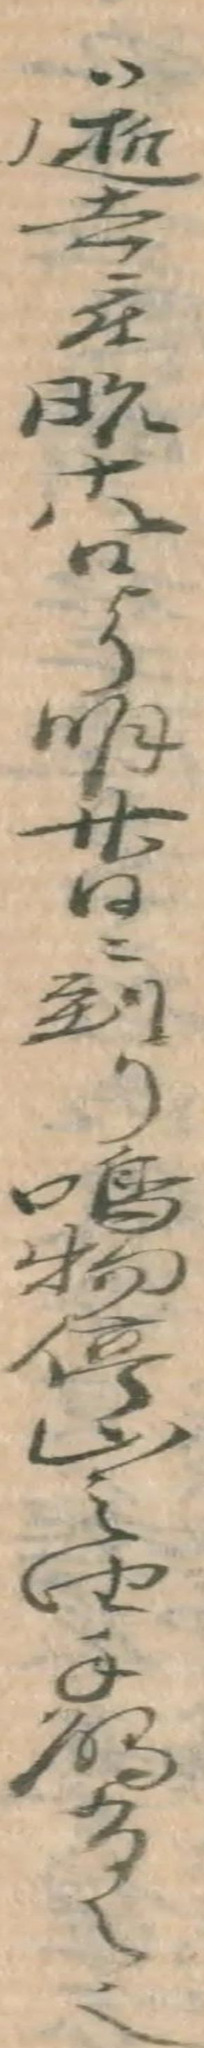御逝去ニ付昨十八日より明廿日ニ到リ鳴物停止之由手触有之也
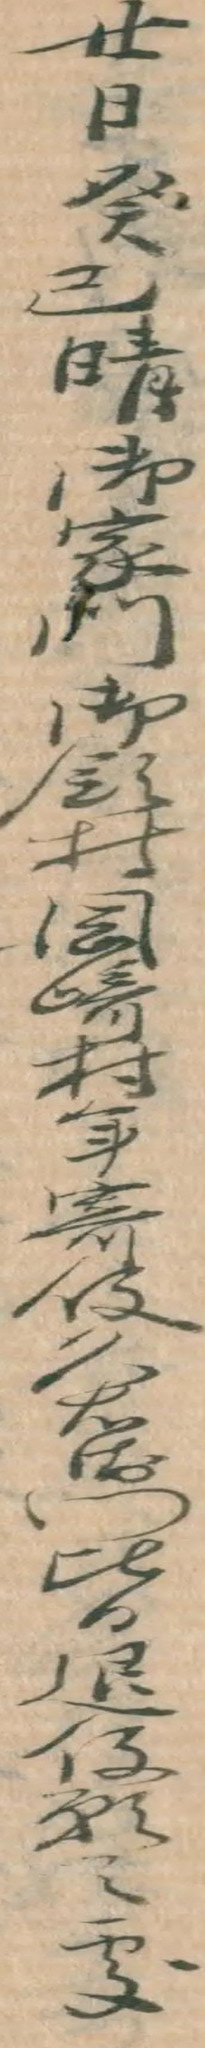廿日癸巳晴御家門御領村岡崎村年寄役久右衛門比日退役願之處
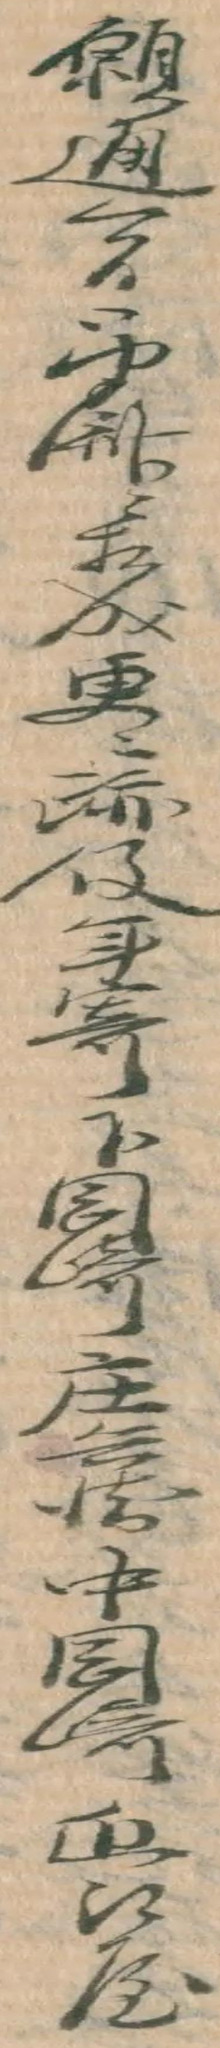願通今日御聞済ニ相成更ニ跡役運寄下岡崎庄兵衛中岡崎近江屋
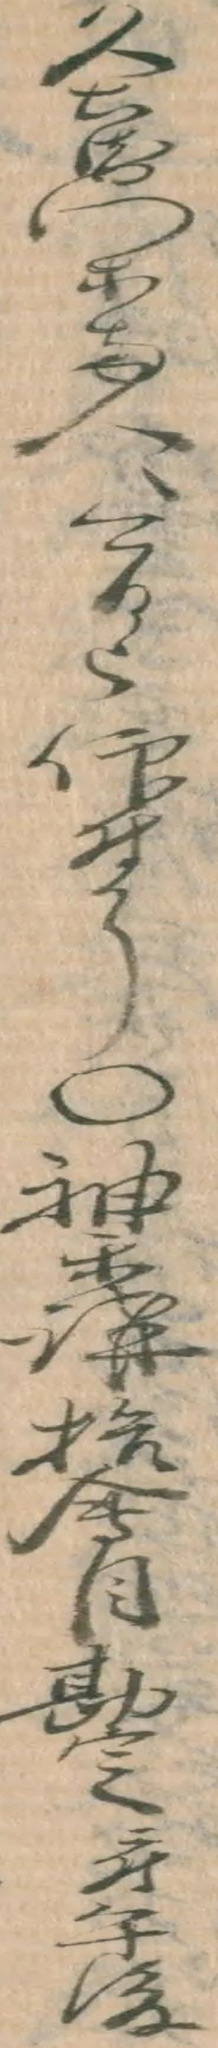久右衛門等両人へ今日被仰付了〇神楽講拾會目勘定ニ付午後
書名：賀茂社記録. 第65冊
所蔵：国立国会図書館 National Diet Library, JAPAN
